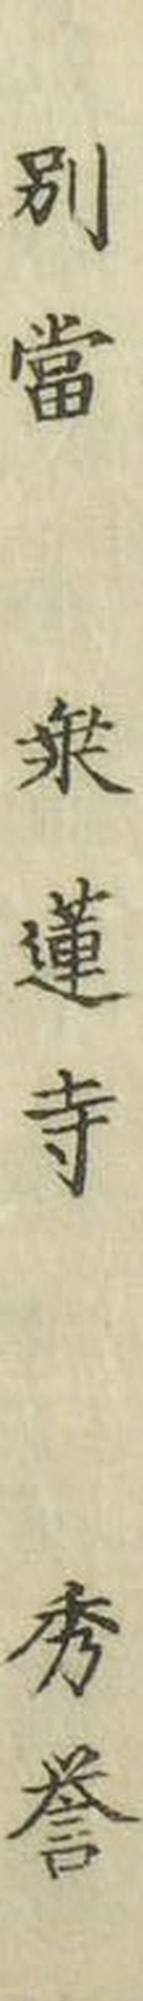別當乗蓮寺秀誉
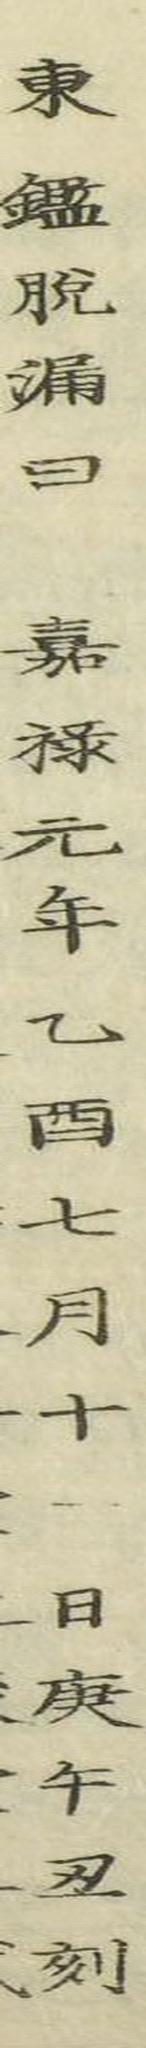東鑑脫漏曰嘉禄元年乙酉七月十一日庚午丑刻
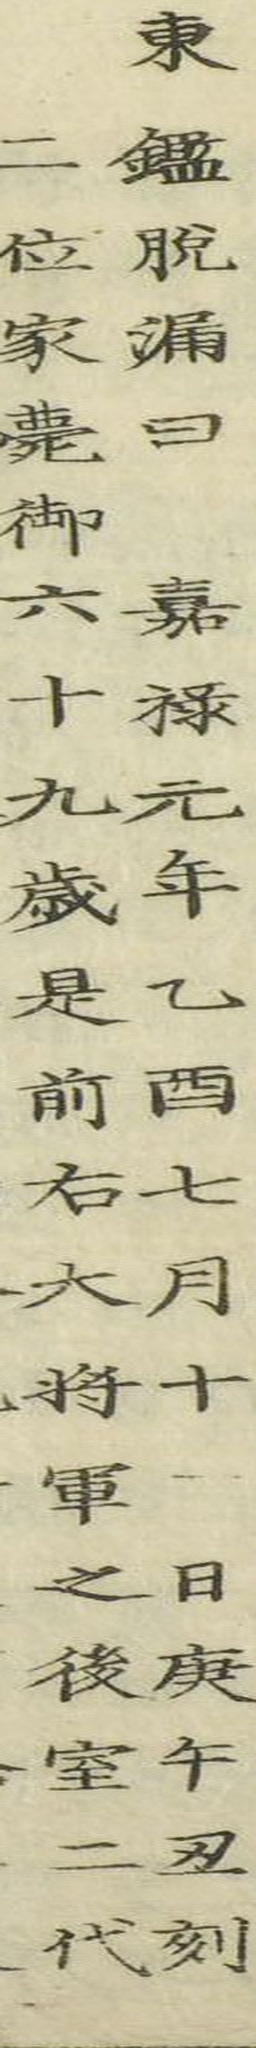二位家薨御六十九歳是前右大将軍之後室二代
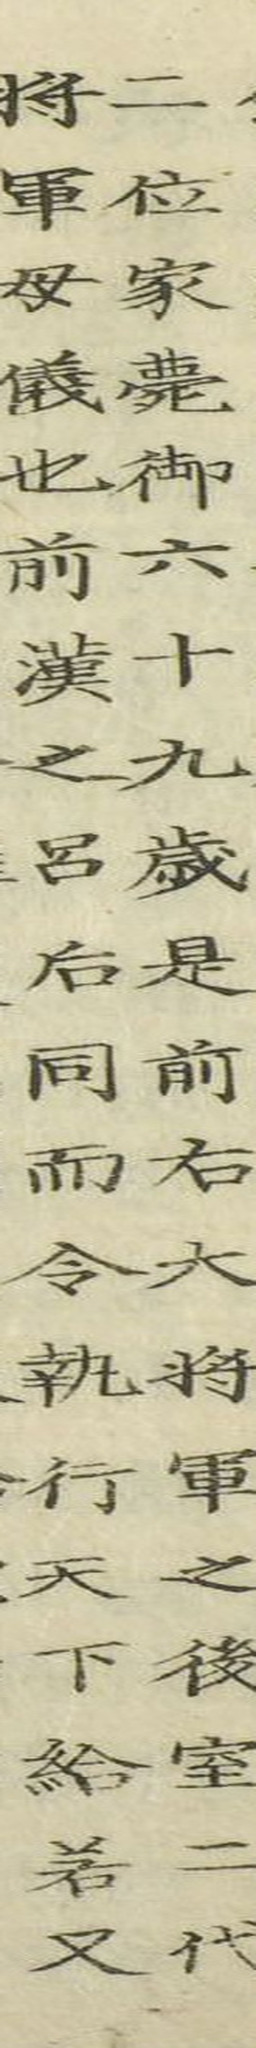将軍母儀也前漢之呂后同而令執行天下給又
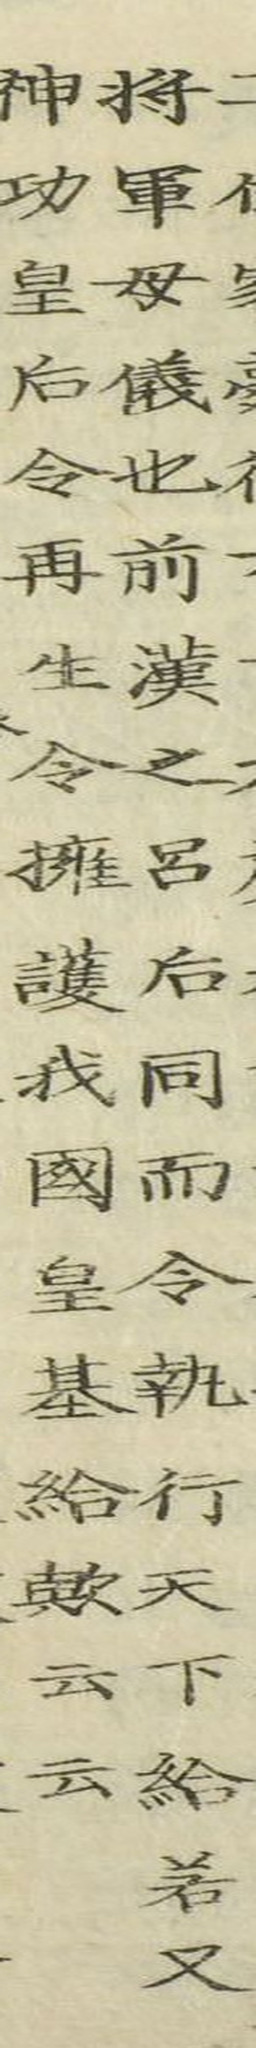神功皇后令再生令擁護我國皇基給歟云云
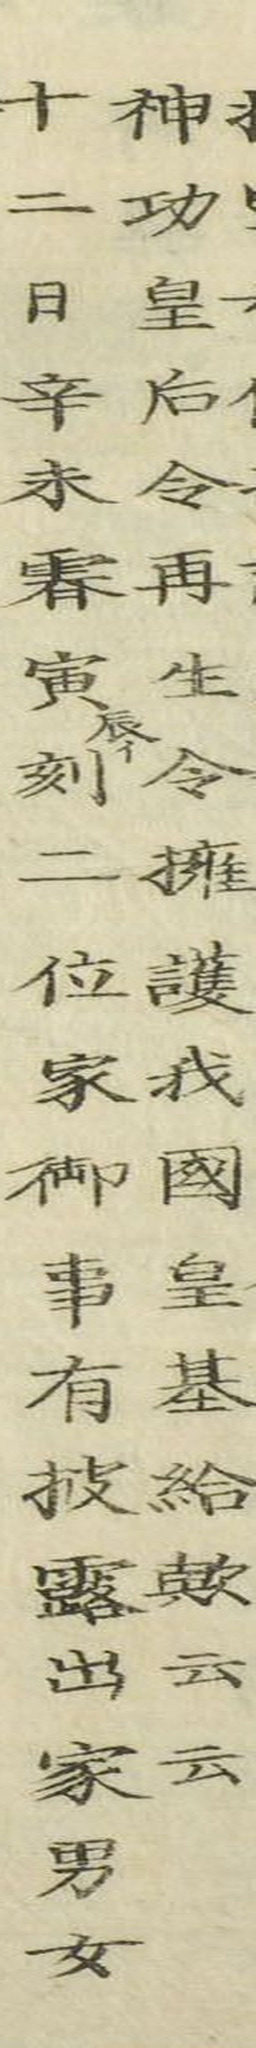十二日辛未霄寅刻二位家御事有披露出家男女
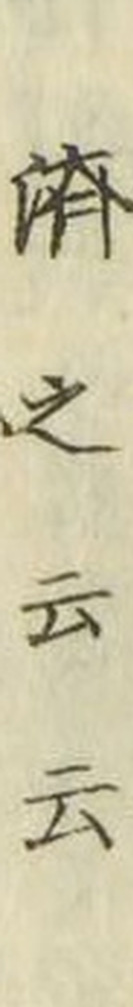済之云云
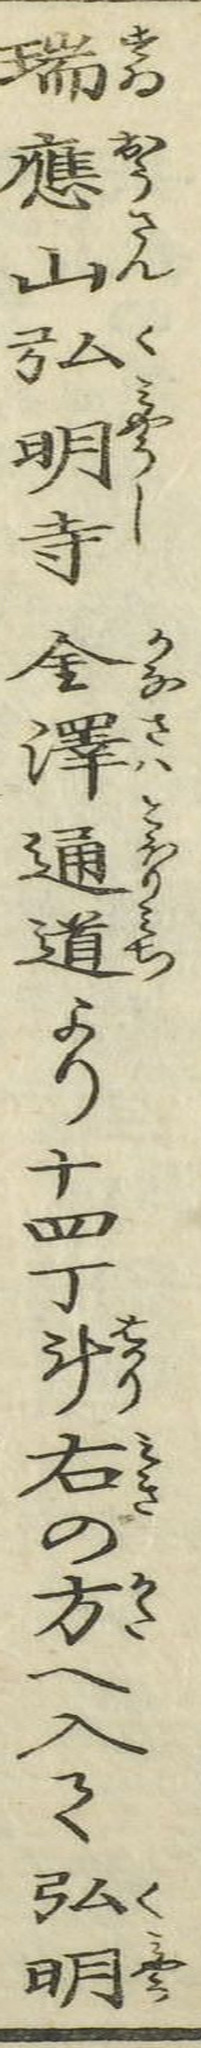瑞應山弘明寺金澤通道より十四丁斗右の方へ入て弘明
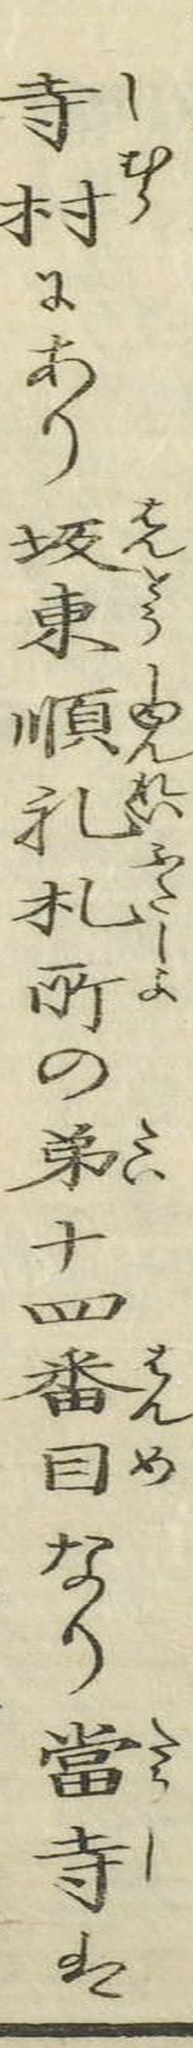寺村にあり坂東順礼札所の弟十四番目なり當寺は
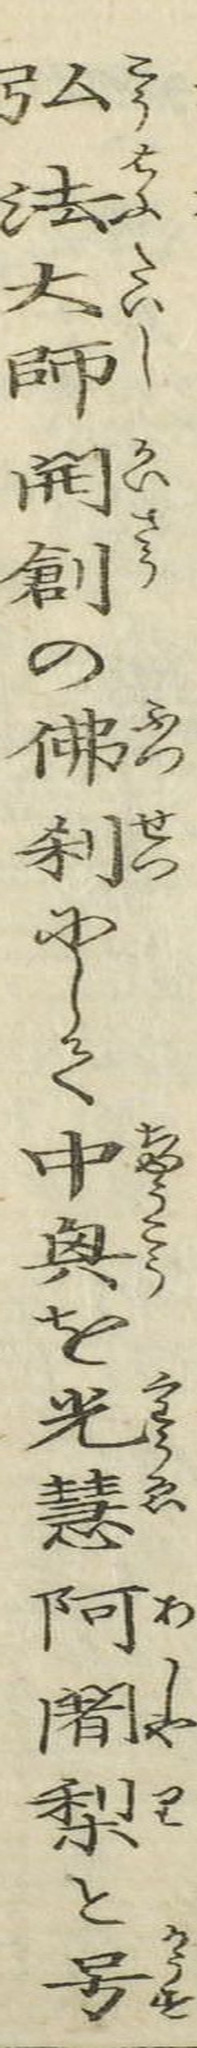弘法大師開創の佛刹にして中興を光慧阿闍梨と号
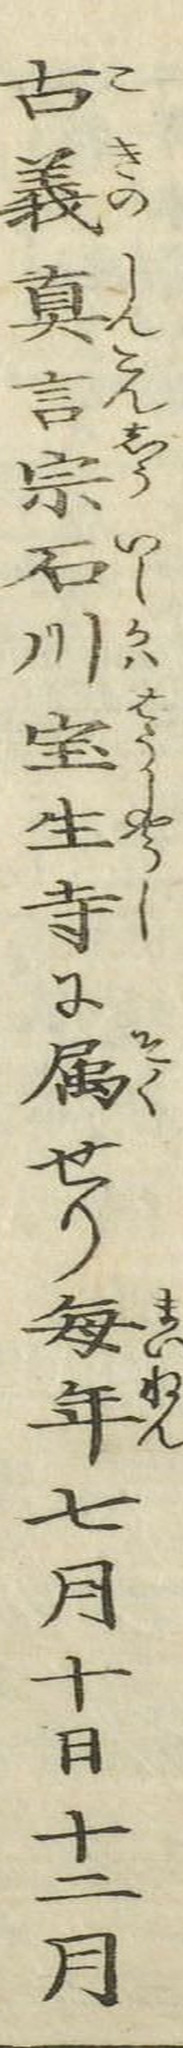古義真言宗石川宝生寺に属せり毎年七月十日十二月
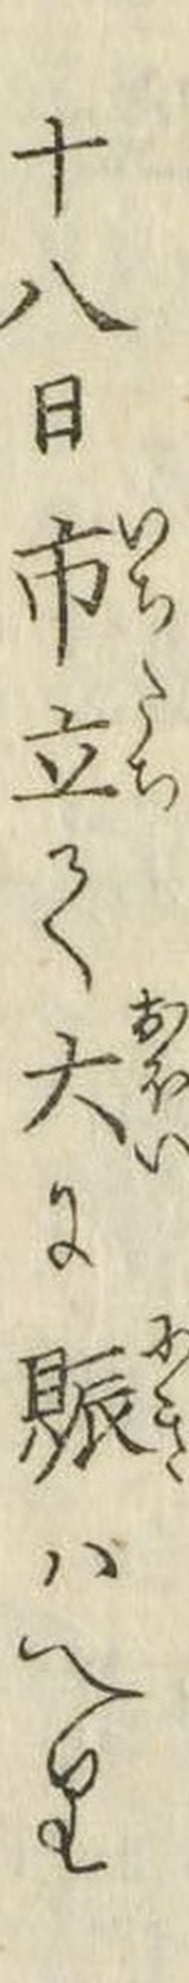十八日市立て大に賑はへり
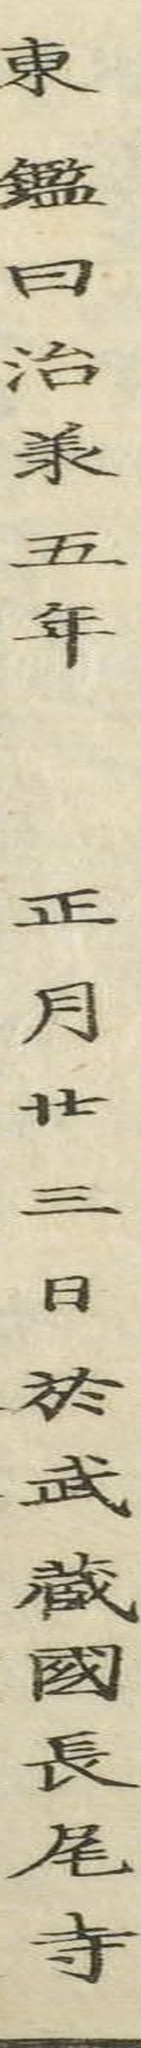東鑑曰治承五年正月廿三日於武蔵國長尾寺
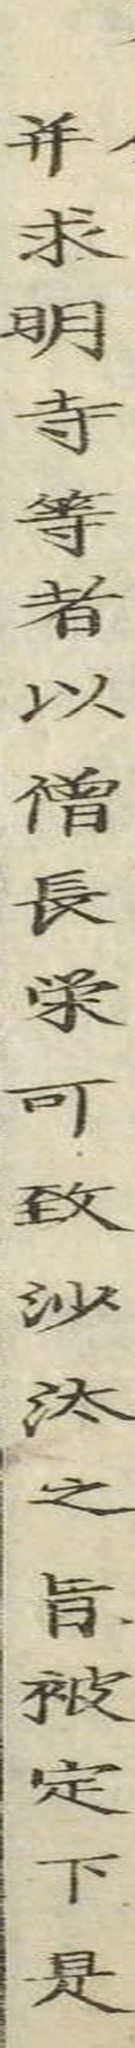幷求明寺等者以僧長栄可致沙汰之旨被定下是
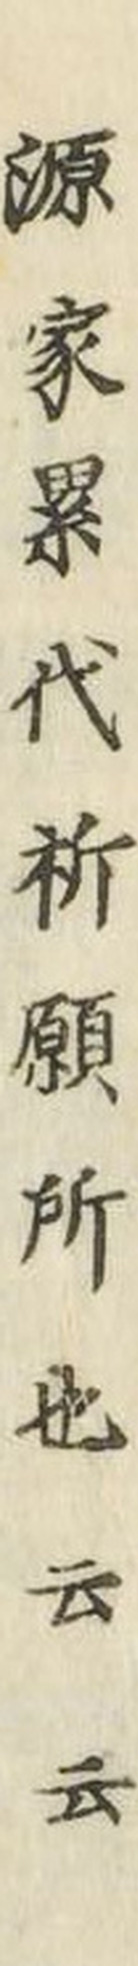源家累代祈願所也云云
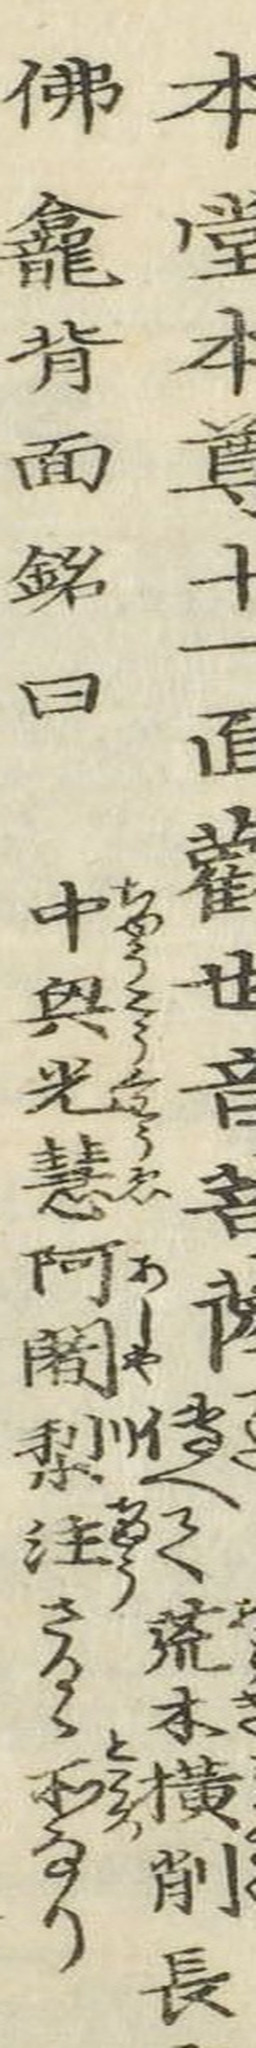佛龕背面銘曰中興光慧阿闍梨注さるゝ所なり
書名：江戸名所図会 20巻 巻之6
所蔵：東京学芸大学教育コンテンツアーカイブ
